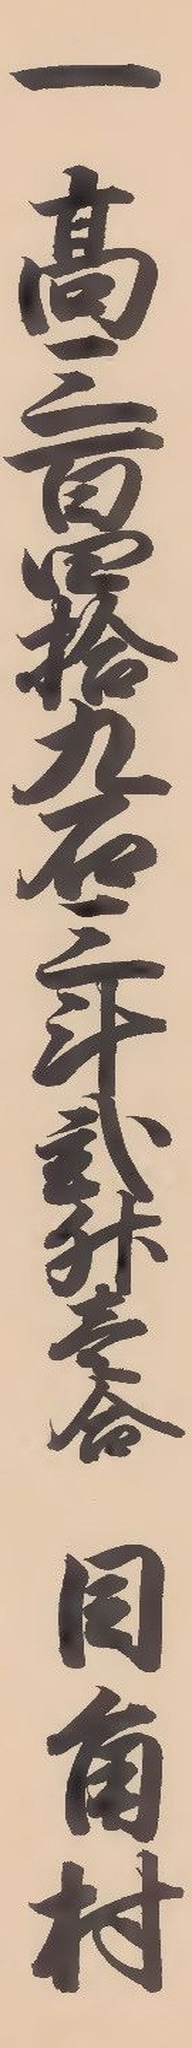一高三百四拾九石三斗弐升壱合目角村
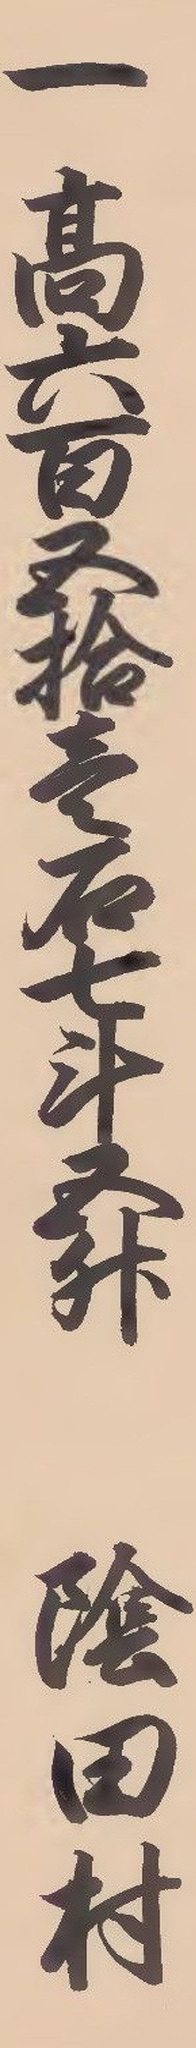一高六百五拾壱石七斗五升陰田村

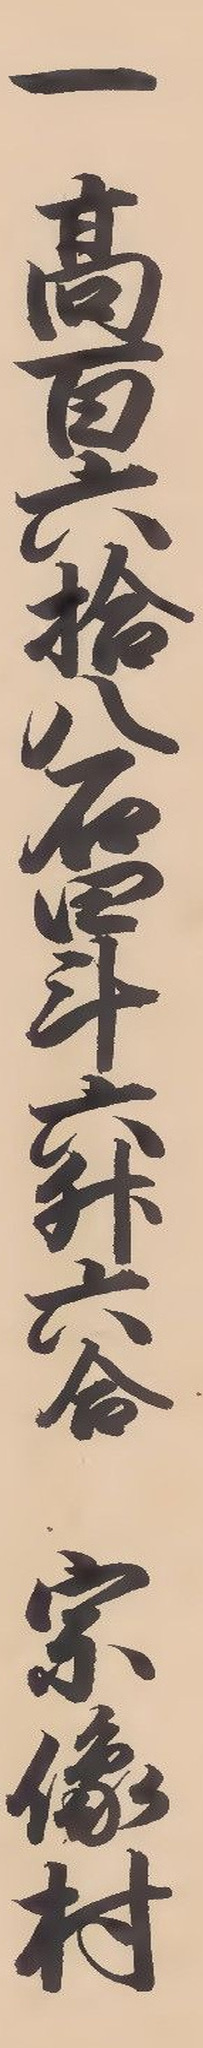一高百六拾八石四斗六升六合宗像村
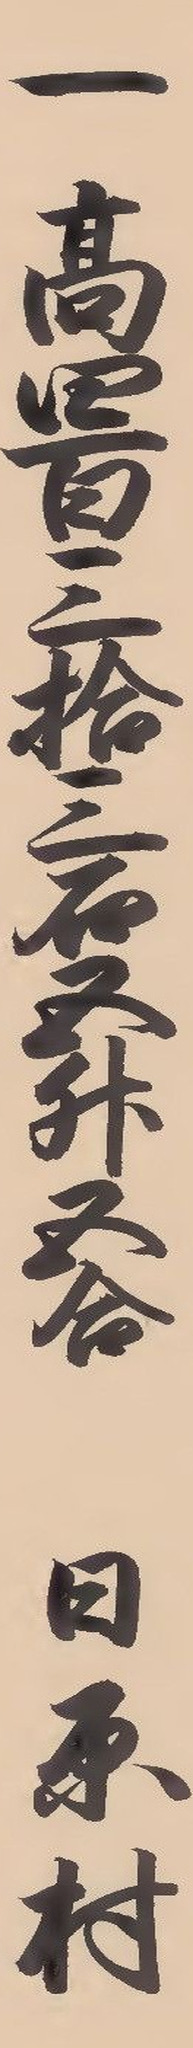一高四百三拾三石五升五合日原村
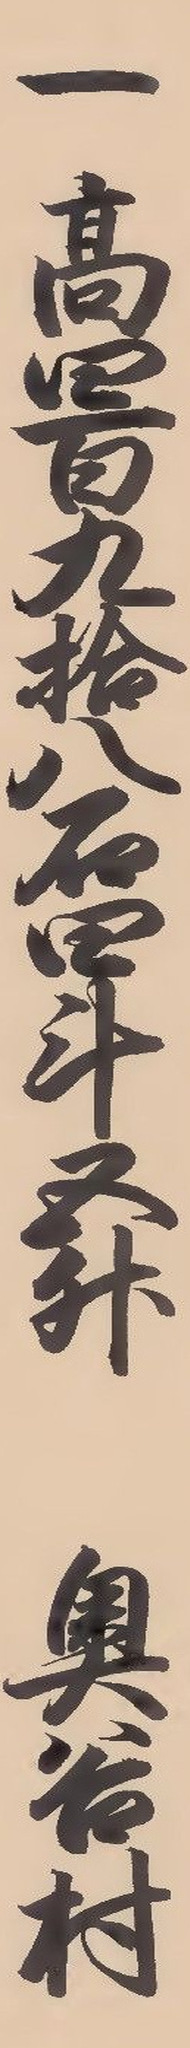一高四百九拾八石四斗五升奥谷村
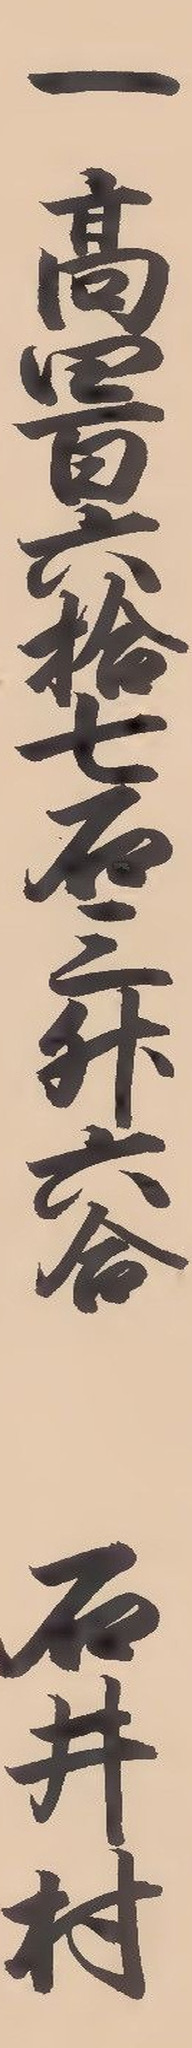一高四百六拾七石三升六合石井村
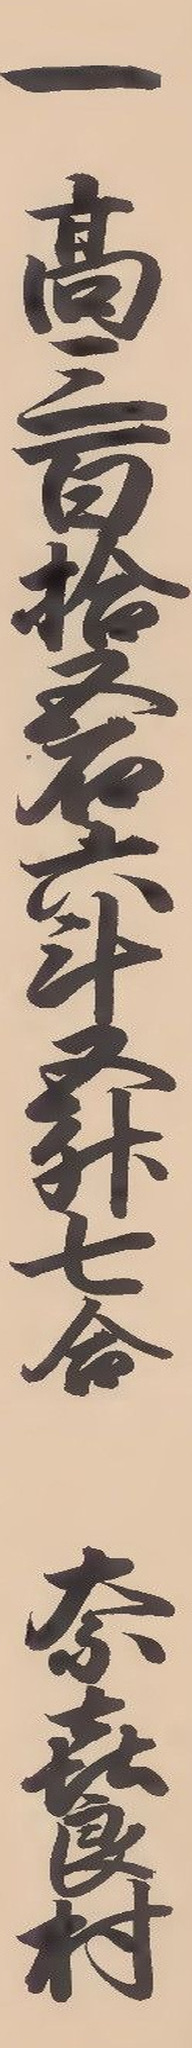一高三百拾五石六斗五升七合奈喜良村
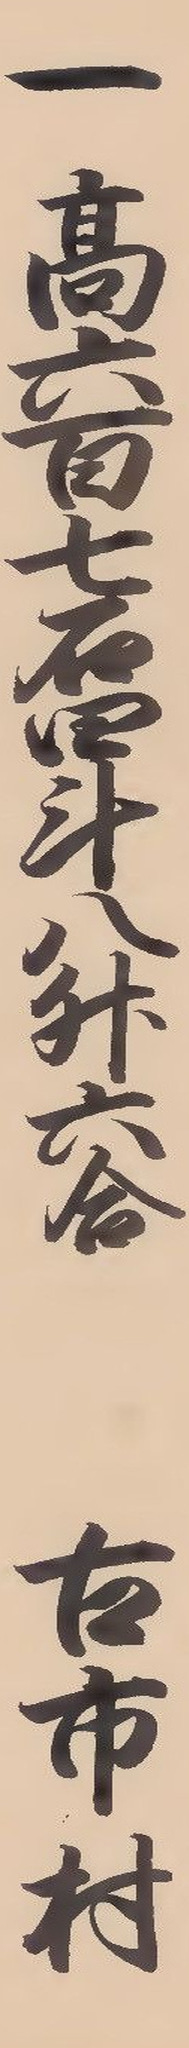一高六百七石四斗八升六合古市村
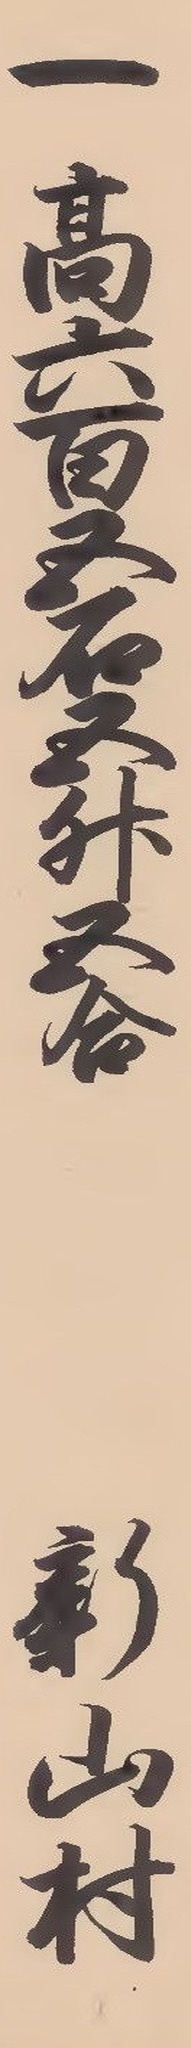一高六百五石五升五合新山村
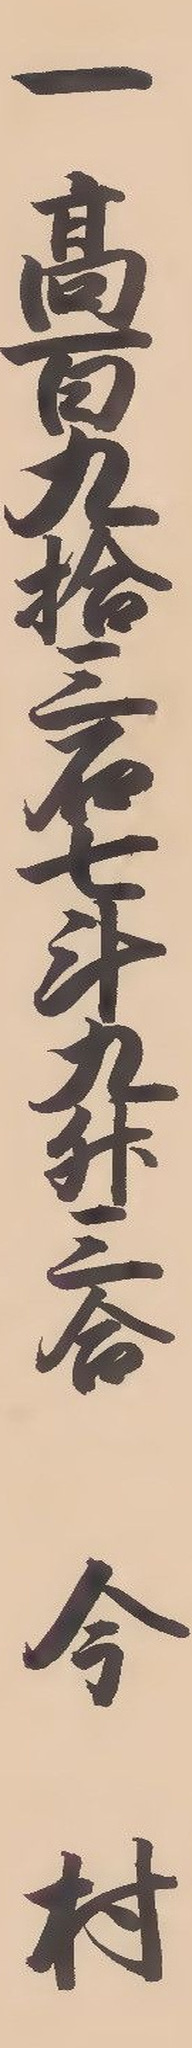一高百九拾三石七斗九升三合今村

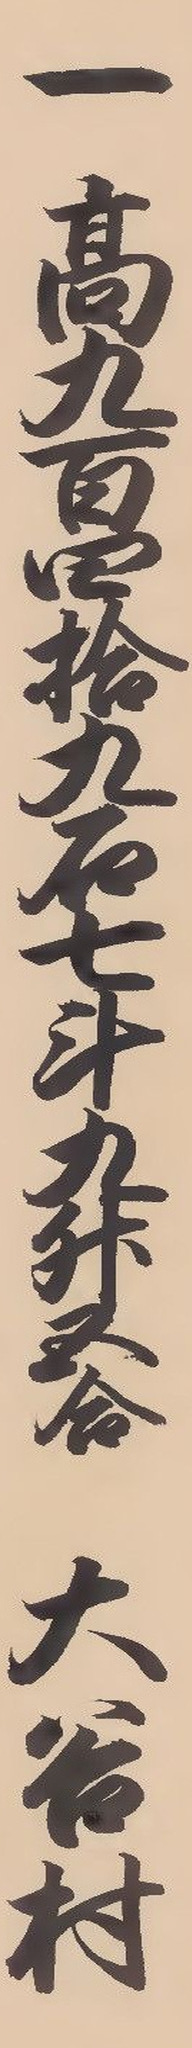一高九百四拾九石七斗九升五合大谷村
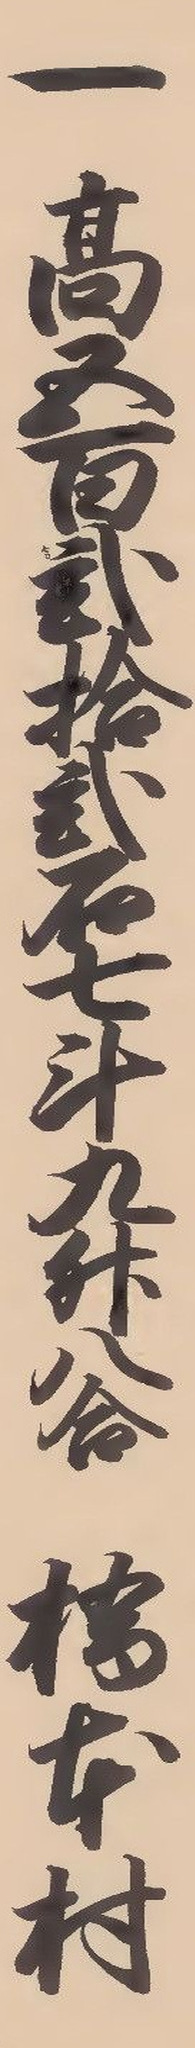一高五百弐拾弐石七斗九升八合橋本村
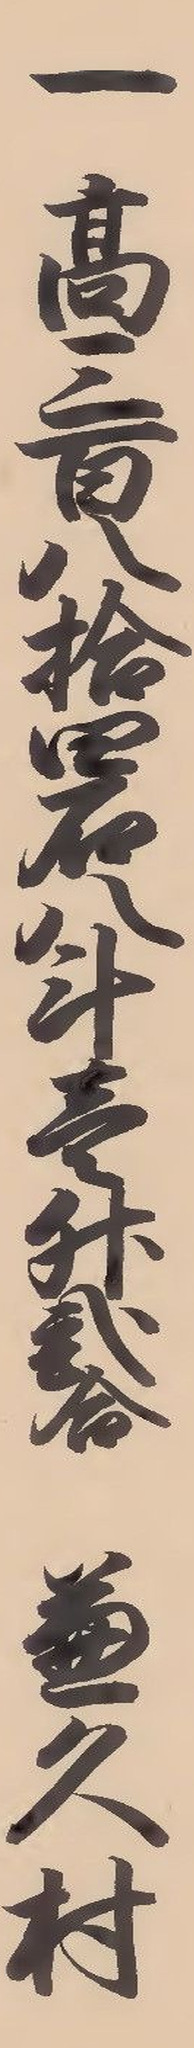一高三百八拾四石八斗壱升弐合兼久村
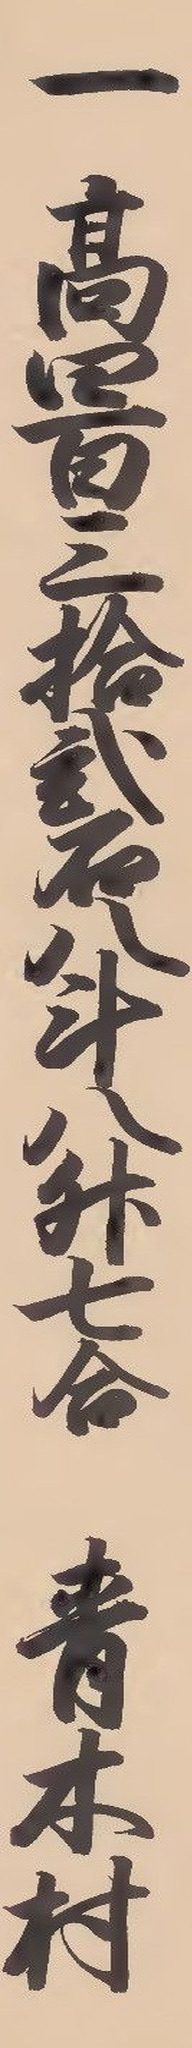一高四百三拾弐石八斗八升七合青木村
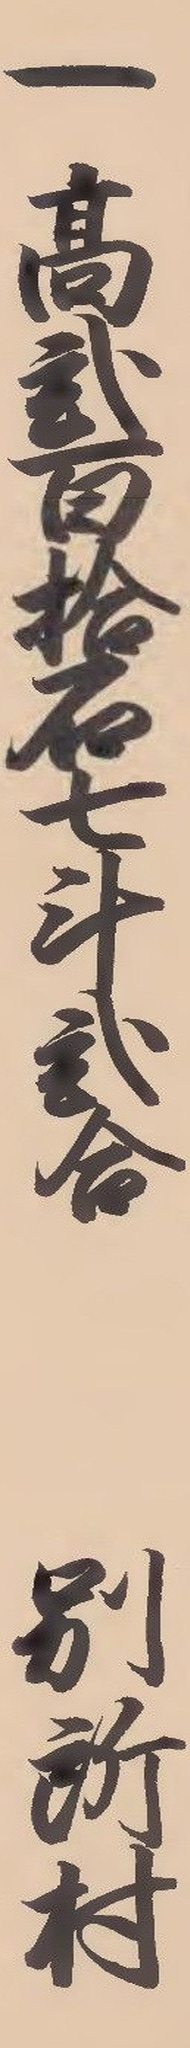一高弐百拾石七斗弐合別所村
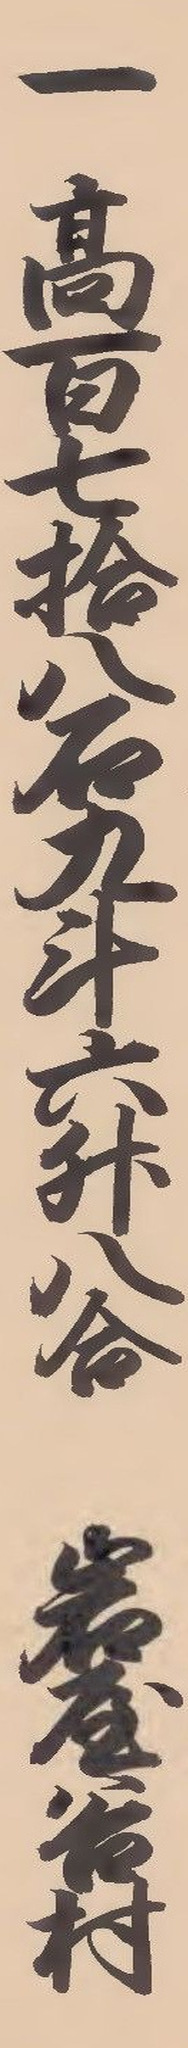一高百七拾八石九斗六升八合岩屋谷村
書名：伯耆国郷帳
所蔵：国立公文書館 National Archives of Japan
